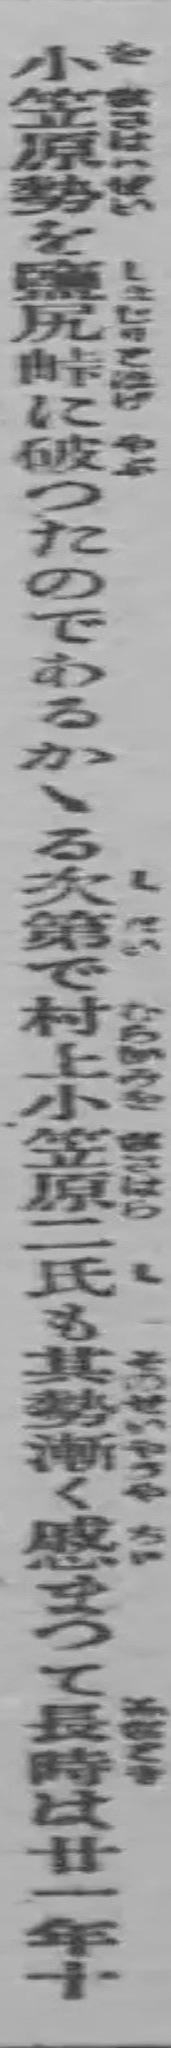小笠原勢を塩尻峠に破つたのであるかゝる次第で村上小笠原二氏も其勢漸く慼まつて長時は廿一年十
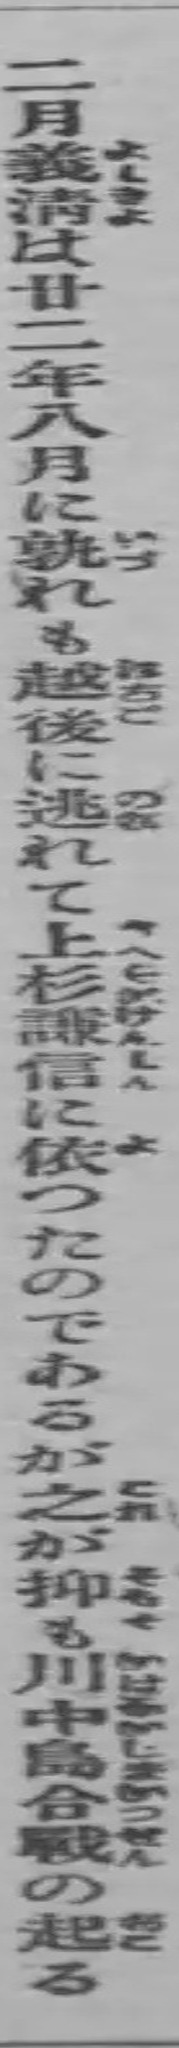上杉謙信二月義清は廿二年八月に孰れも越後に逃れて上杉謙信に依つたのであるが之が抑も川中島合戦の起る
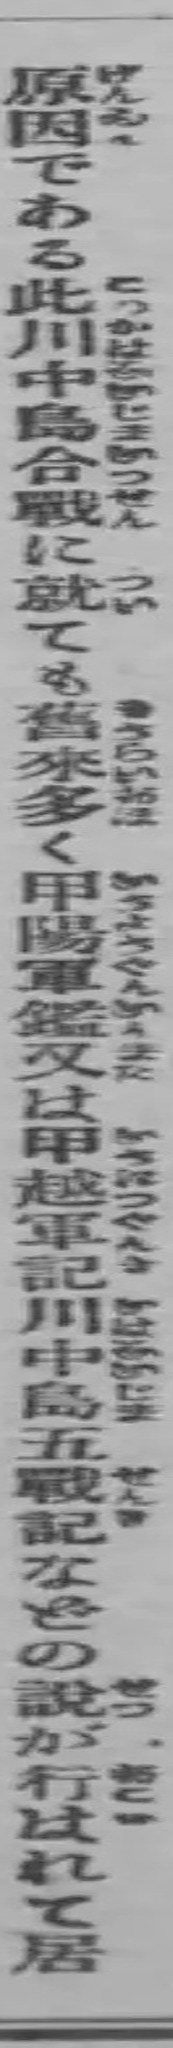川中島合戦原因である此川中島合戦に就ても旧来多く甲陽軍鑑又は甲越軍記川中島五戦記などの説が行はれて居
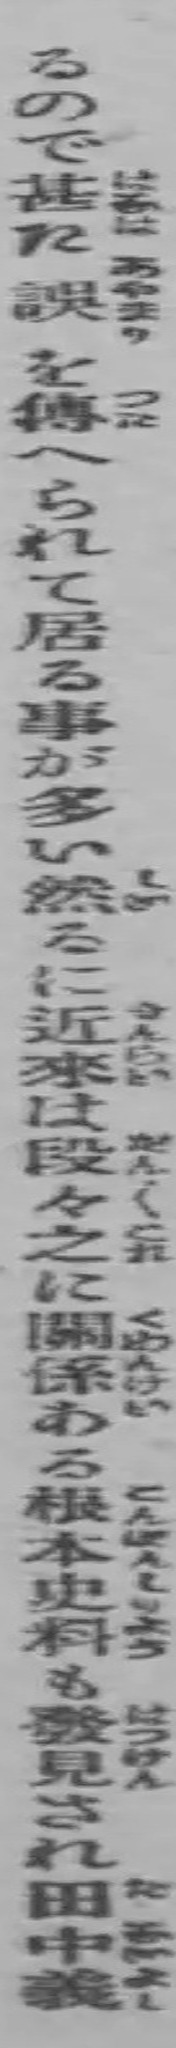るので甚た誤を伝へられて居る事が多い然るに近来は段々之に関係ある根本史料も発見され田中義
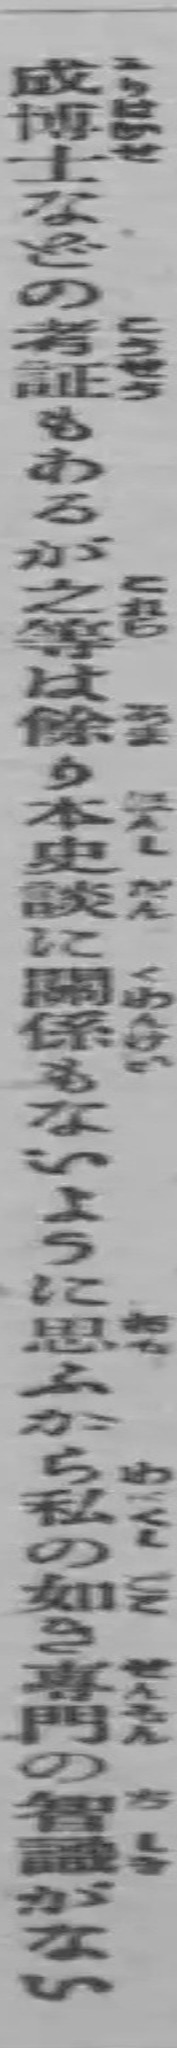成博士などの考証もあるが之等は余り本史談に関係もないように思ふから私の如き専門の智識がない
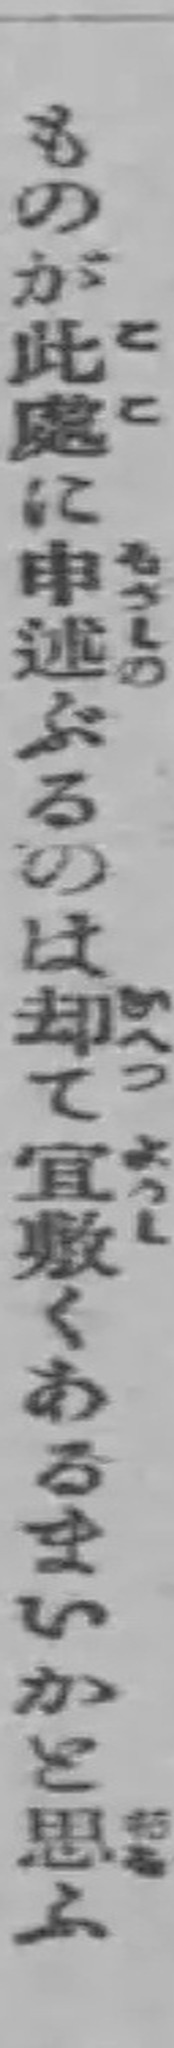ものが此処に申述ぶるのは却て宜敷くあるまいかと思ふ
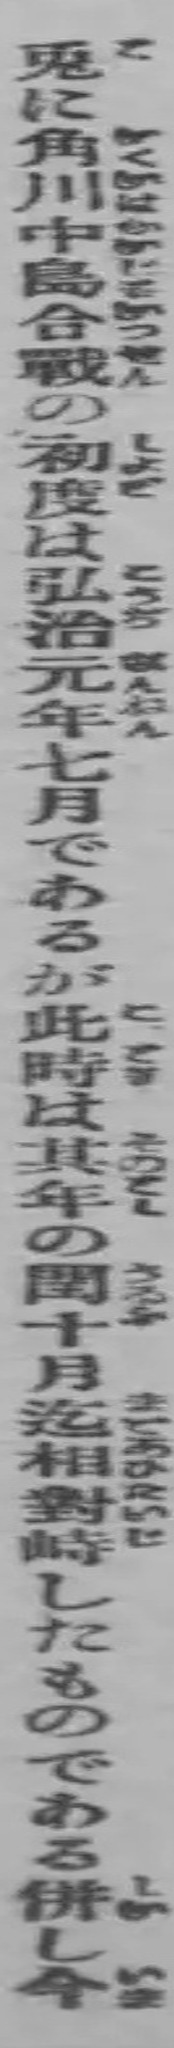兎に角川中島合戦の初度は弘治元年七月であるが此時は其年の閏十月迄相対峙したものである併し今
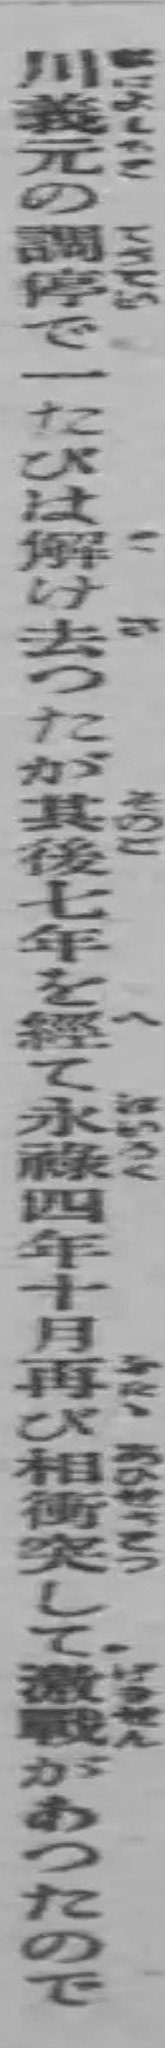川義元の調停で一たびは解け去つたが其後七年を経て永禄四年十月再び相衝突して激戦があつたので
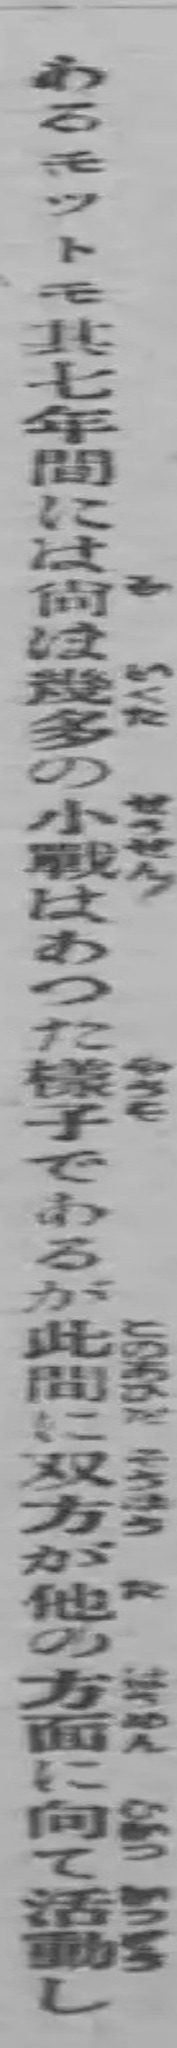あるモツトモ其七年間には尚ほ幾多の小戦はあつた様子であるが此間に双方が他の方面に向て活動し
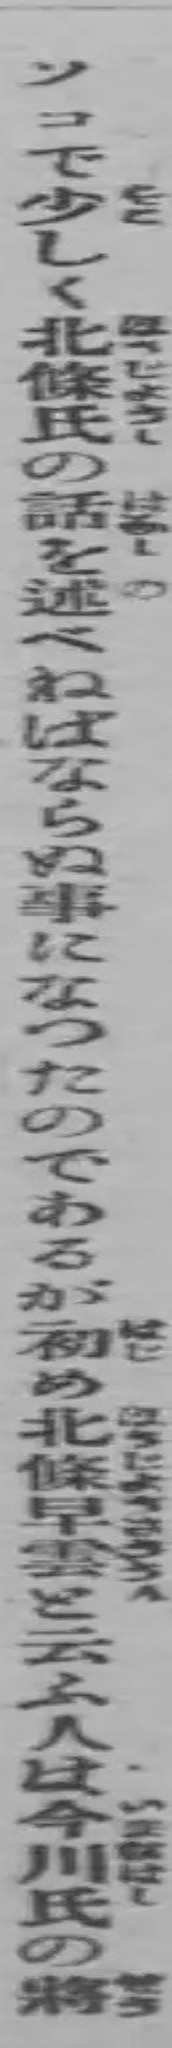北条氏ソコで少しく北条氏の話を述べねばならぬ事になつたのであるが初め北条早雲と云ふ人は今川氏の将
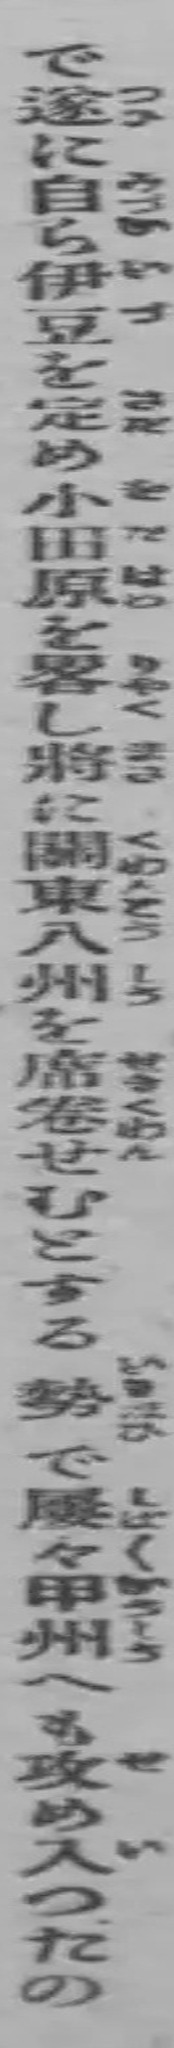で遂に自ら伊豆を定め小田原を略し将に関東八州を席巻せむとする勢で屡々甲州へも攻め入つたの
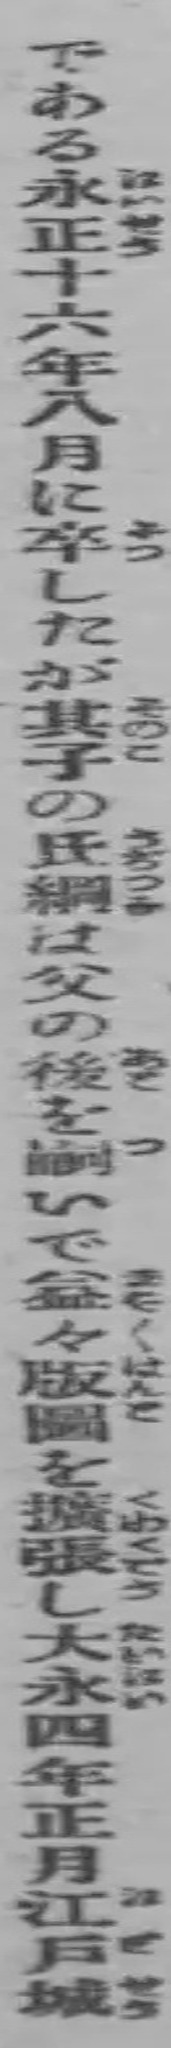北条氏綱である永正十六年八月に卒したが其子の氏綱は父のあと後を嗣いで益々版図を拡張し大永四年正月江戸城
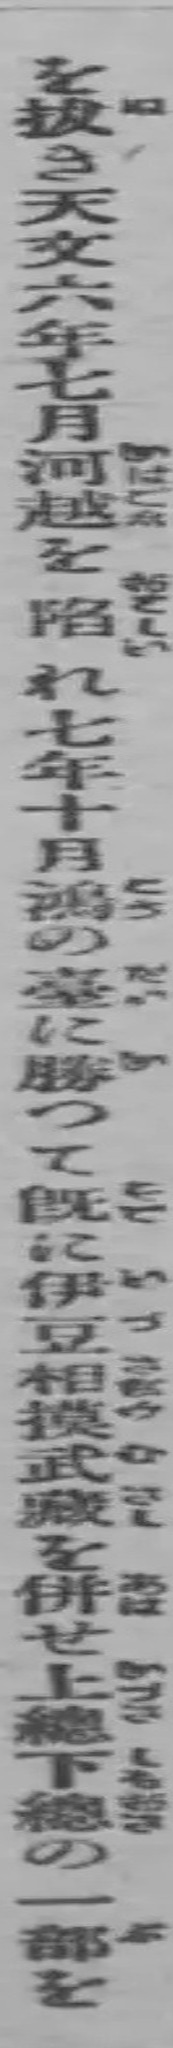を抜き天文六年七月河越を陥れ七年十月鴻の台に勝つて既に伊豆相模武蔵を併せ上総下総の一部を
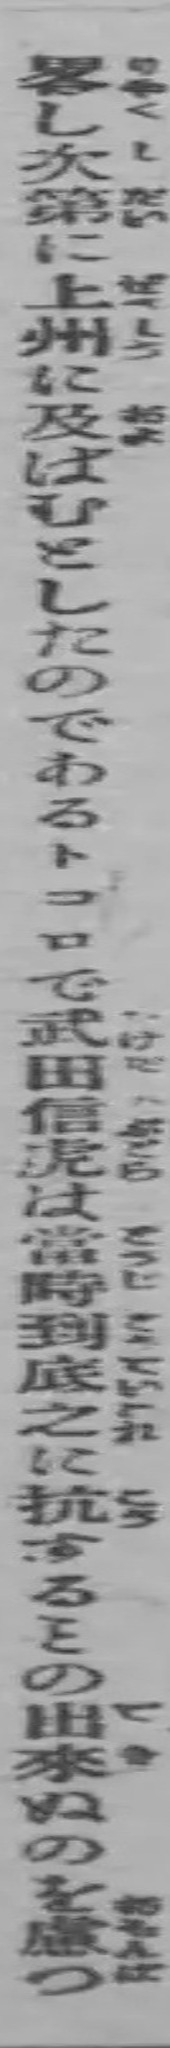略し次第に上州に及ばむとしたのであるトコロで武田信虎は当時到底之に抗することの出来ぬのを慮つ
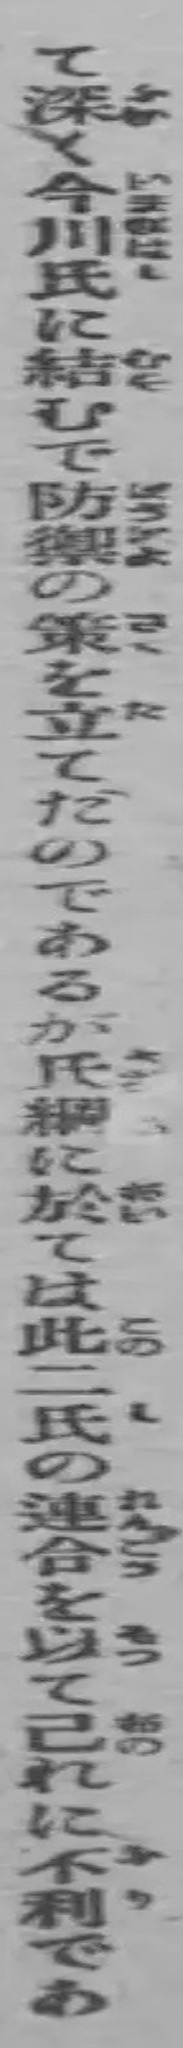て深く今川氏に結むで防禦の策を立てたのあるが氏綱に於ては此二氏の連合を以て己れに不利であ
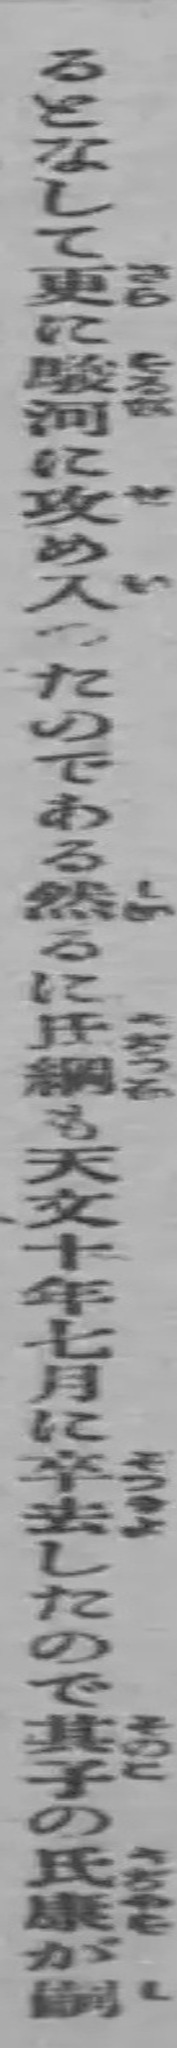北条氏康るとなして更に駿河に攻め入つたのである然るに氏綱も天文十年七月に卒去したので其子の氏康が嗣
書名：豊橋市史談
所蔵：国立国会図書館 National Diet Library, JAPAN
